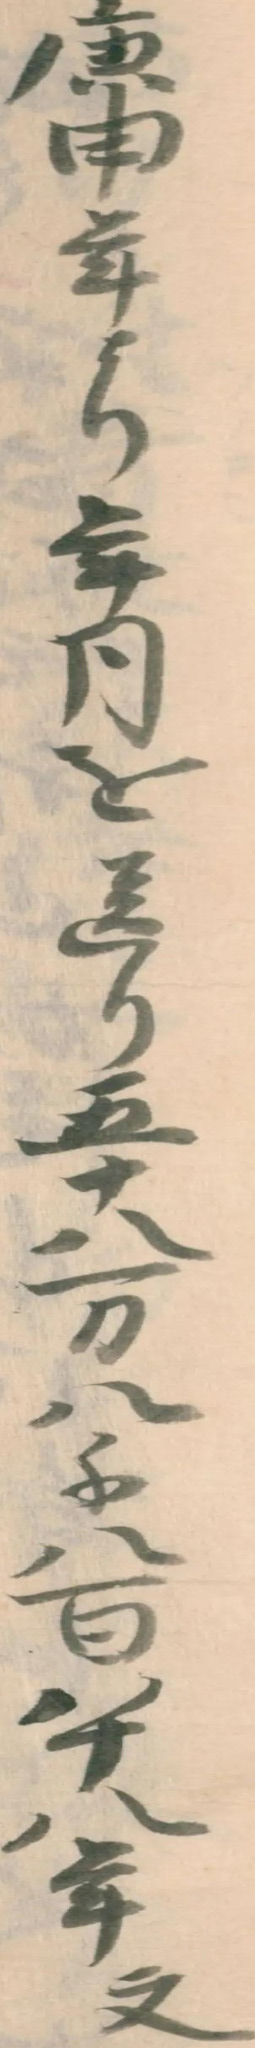庚申年より年月を送り五十八万八千八百八十八年文
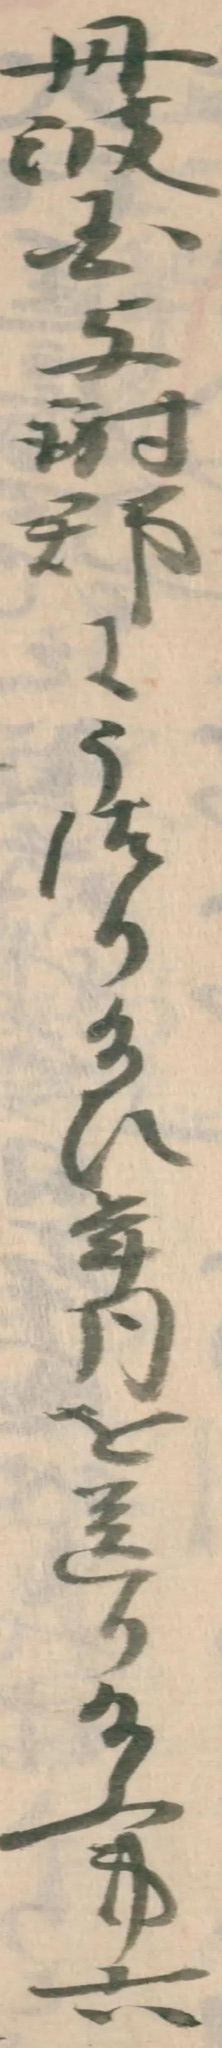丹波国与謝郡にうつり給ひ年月を送り給ふ事六
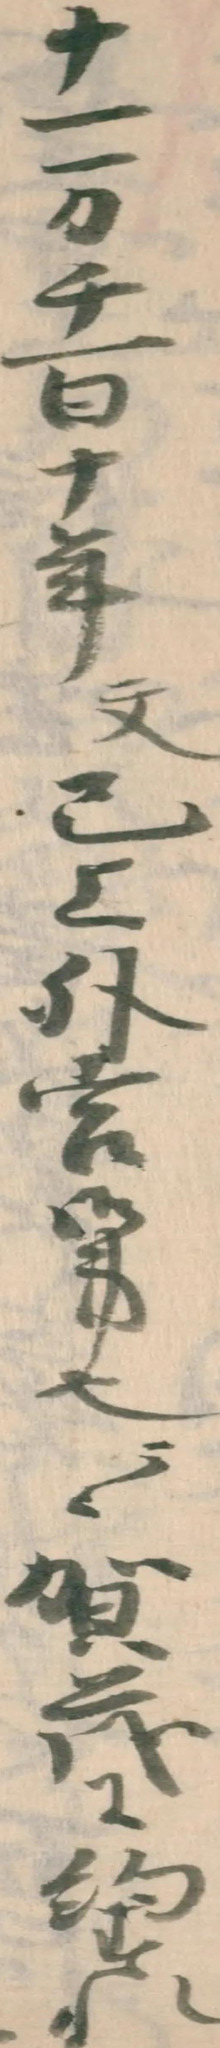十一万千百十年文已上外宮御事也云々賀茂に約すれは
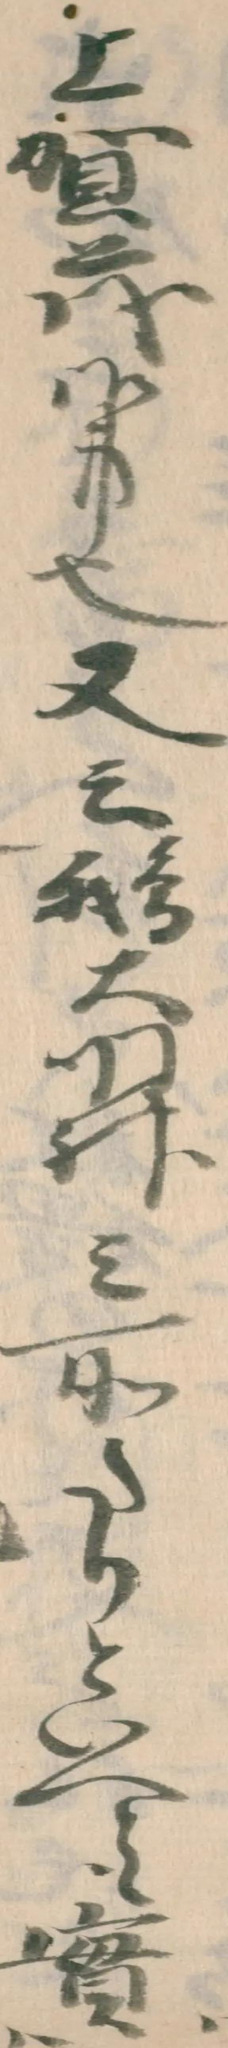上賀茂御事也又云鵝大明神三所たりといへとも実は
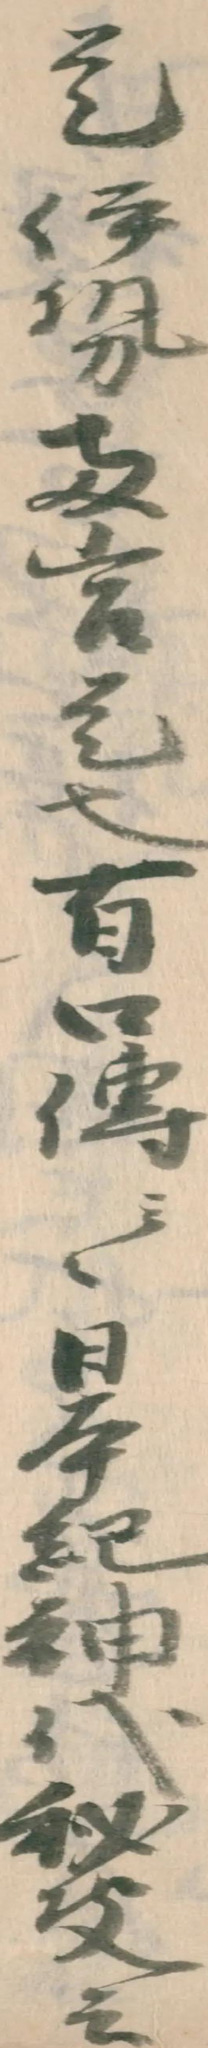是伊勢両宮是也有口伝云々日本紀神代秘決云
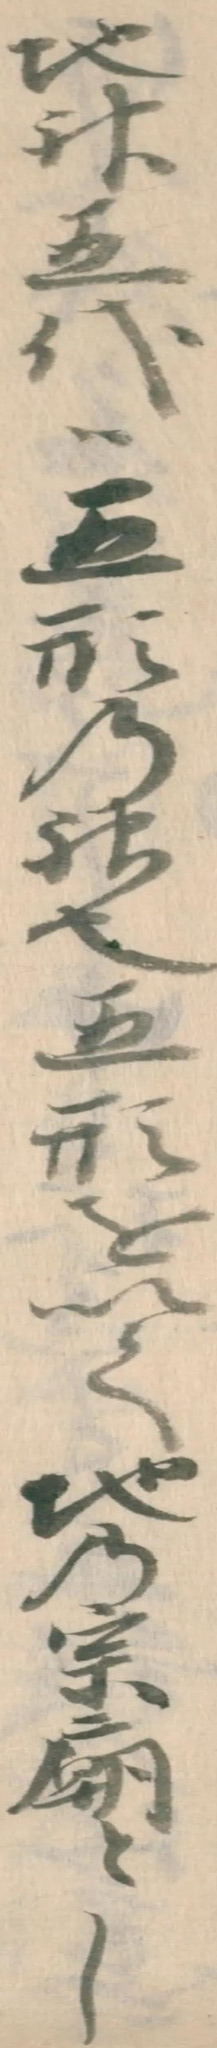地神五代は五形の神也五形を以て地の宗廟とし
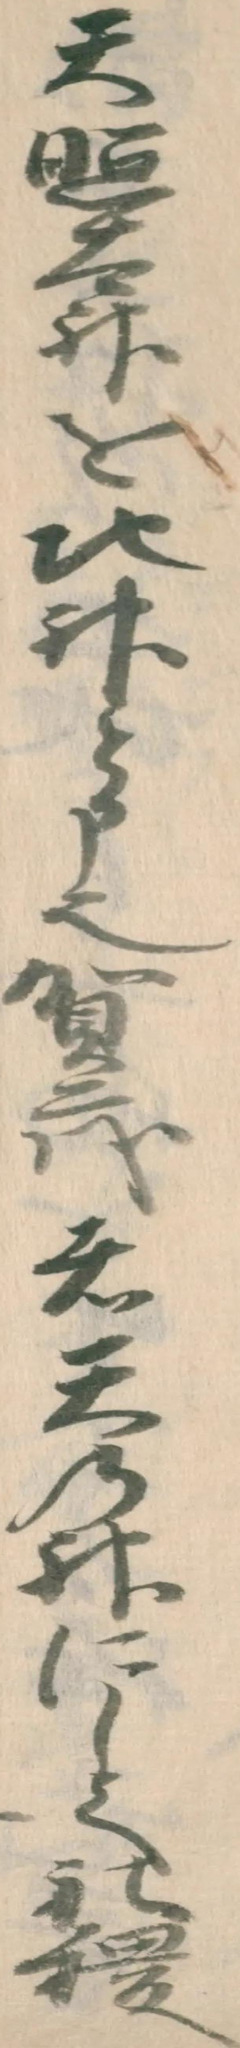天照太神を地神と申也賀茂者天の神にして社稷
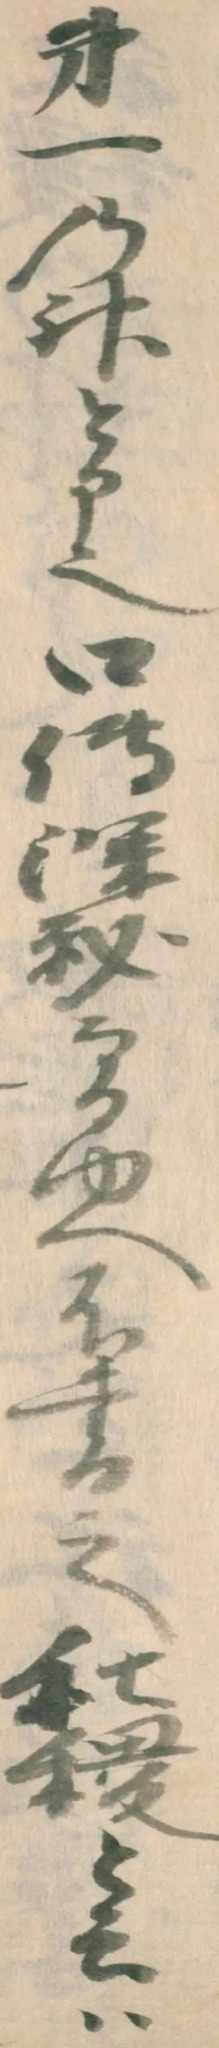第一の神と申也口伝深秘なるゆへ不書之社稷と云は
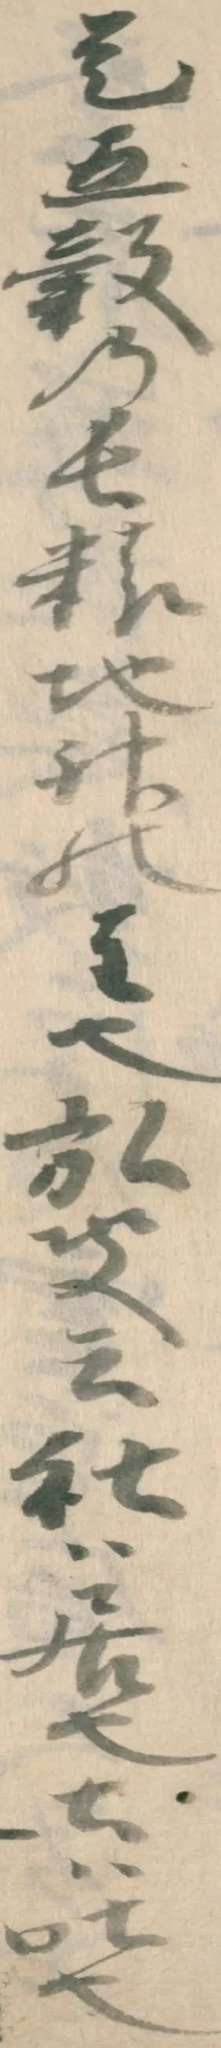是五穀の長精地神の主也弘決云社は居也土は吐也
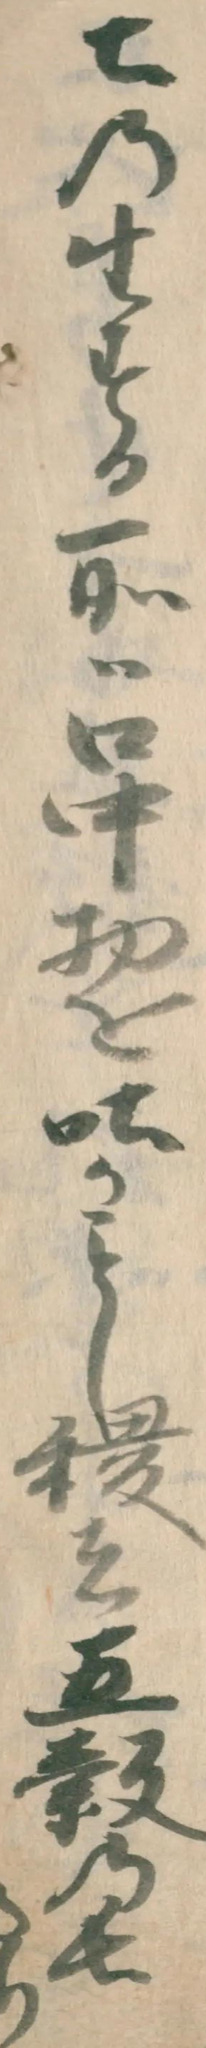土の生する所は口中物を吐かことし稷は五穀の長たり

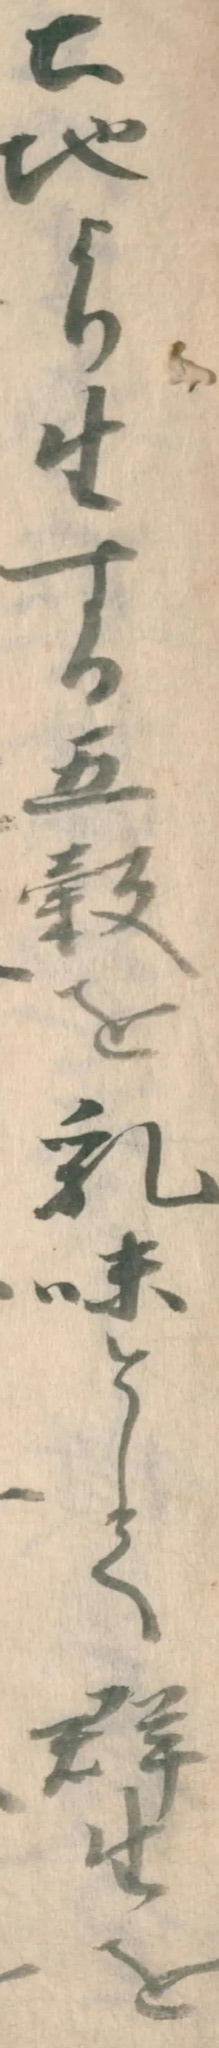土地より生する五穀を乳味として群生を
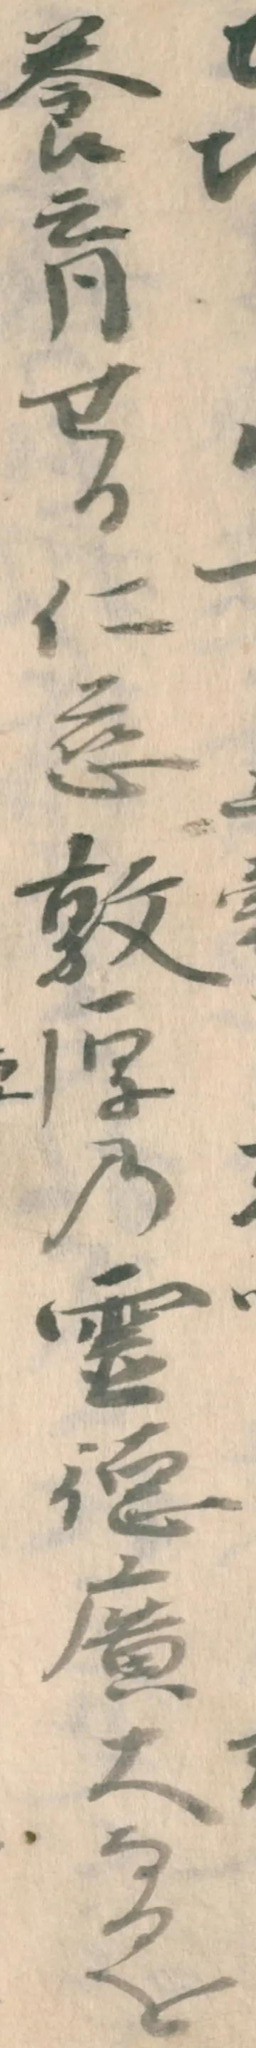養育せる仁慈敦厚の霊徳広大なるを
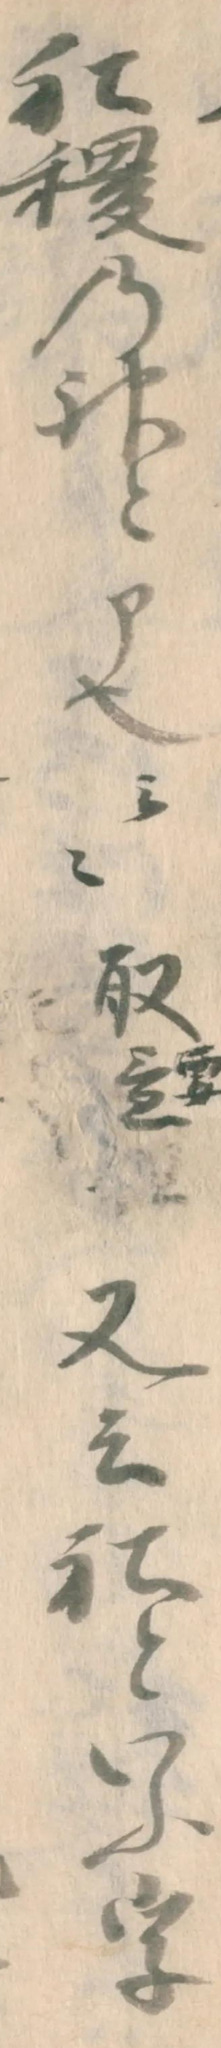社稷の神と申也云々取意又云社といふ字
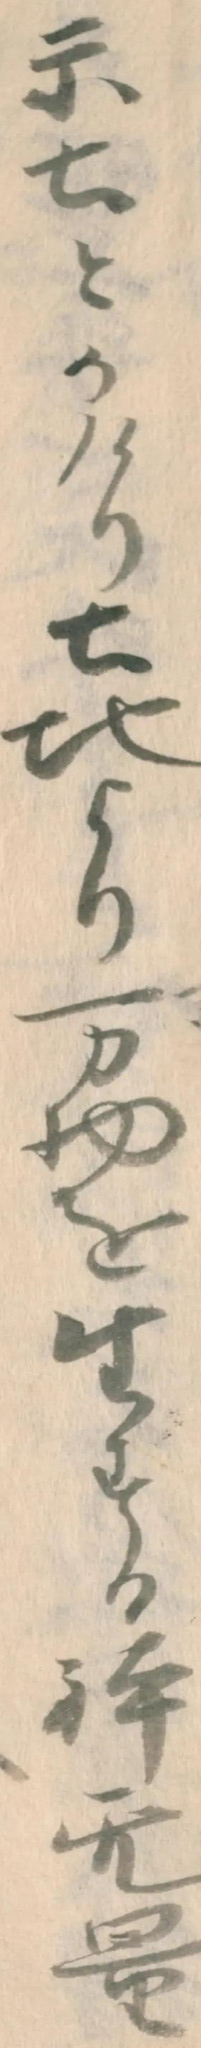示土とかけり土地より万物を生する躰无量
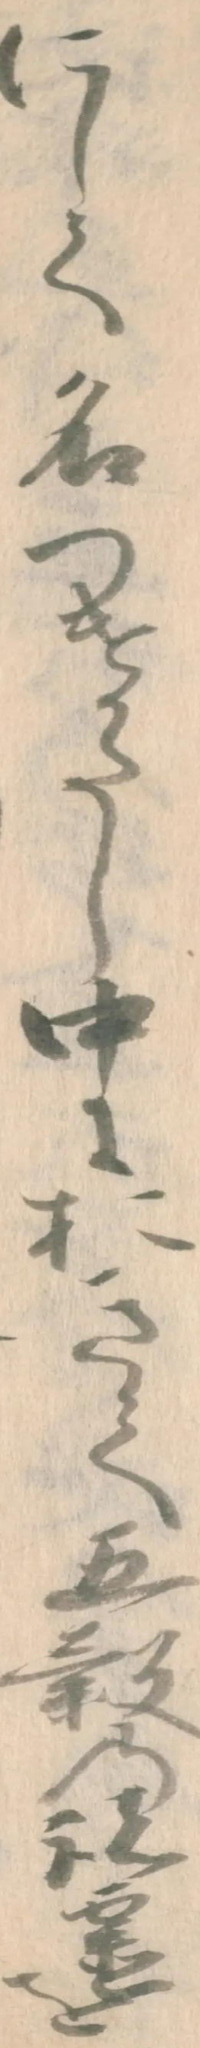にして名つけかたし中におきて五穀の諸霊を
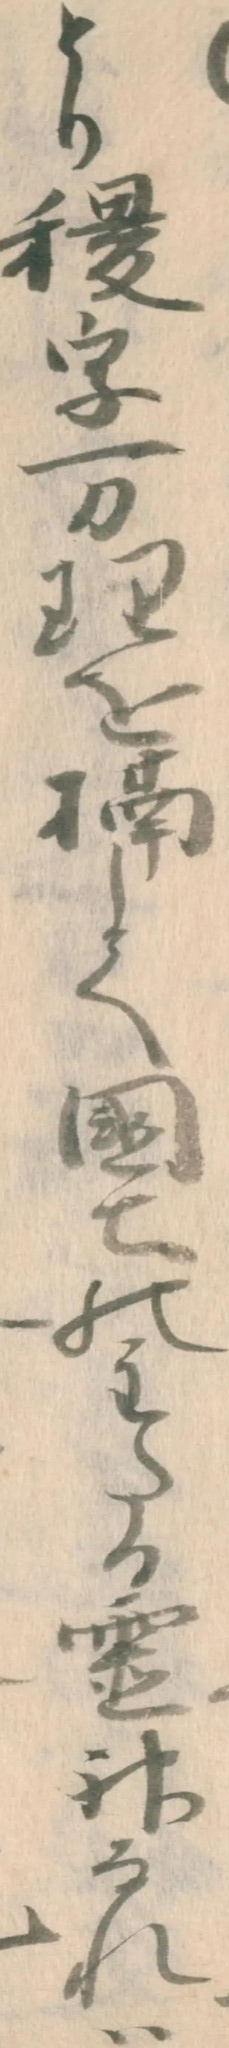とり稷字万理を楠して国土の主たる霊神なれは
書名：賀茂社記録. 第1冊
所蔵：国立国会図書館 National Diet Library, JAPAN
